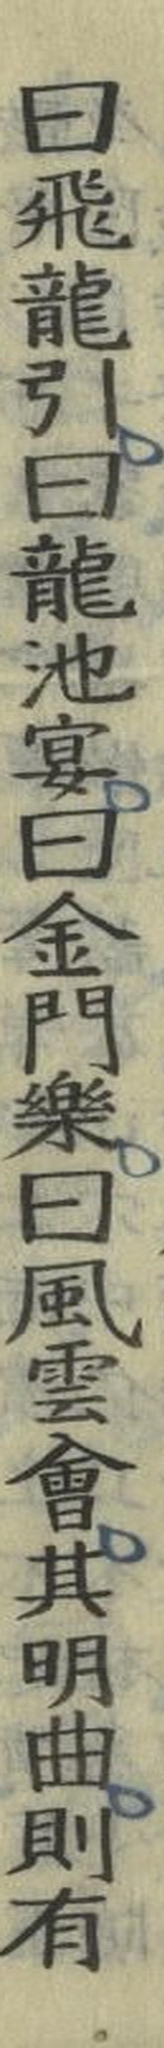曰飛龍引。曰龍池宴。曰金門樂。曰風雲會。其明曲。則有
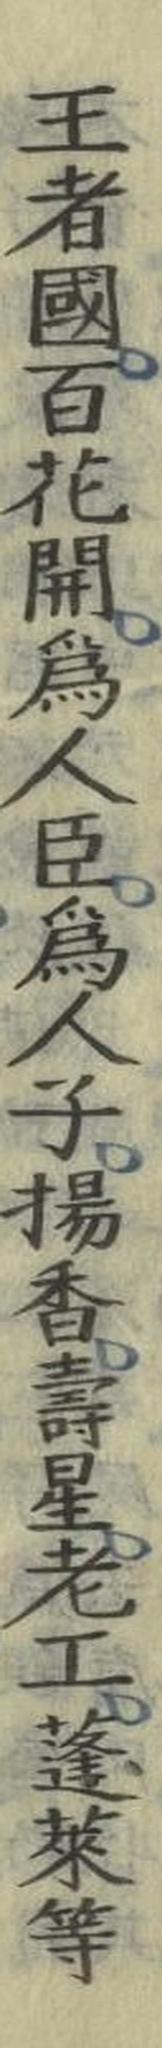王者國。百花開。爲人臣。爲人子。揚香。壽星。老工。蓬萊等
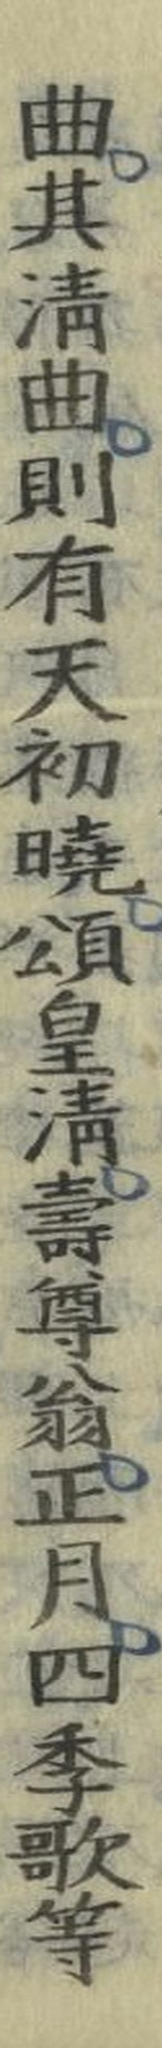曲。其淸曲。則有天初曉。頌皇淸。壽尊翁。正月四季歌等
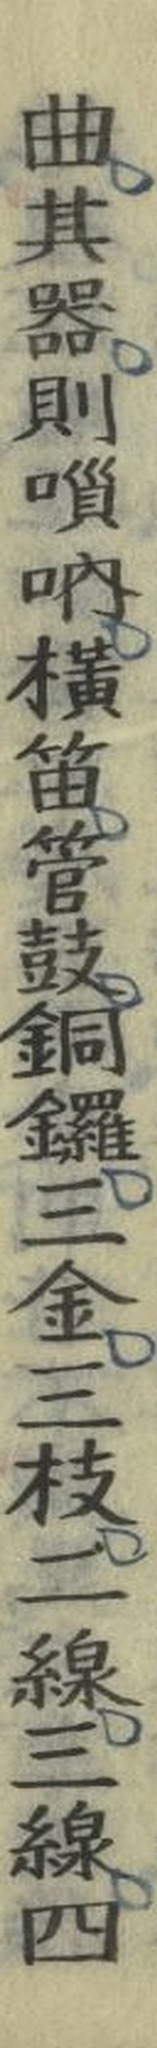曲。其器則嗩吶。横笛。管鼓。銅鑼。三金。三枝。二線。三線。四
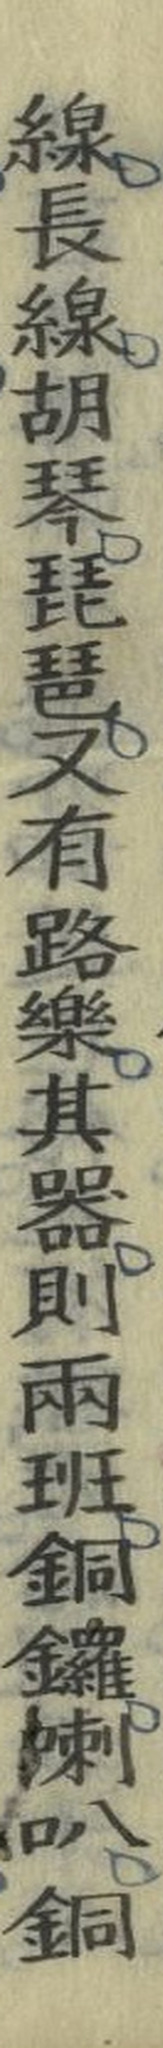線。長線。胡琴。琵琶。又有路樂。其器則兩班。銅鑼。喇叭。銅
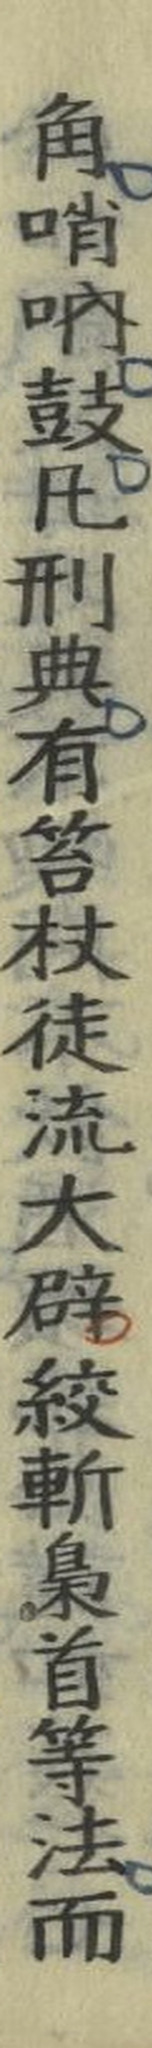角。嗩吶。鼓。凡刑典。有笞杖徒流大辟絞斬梟首等法。而
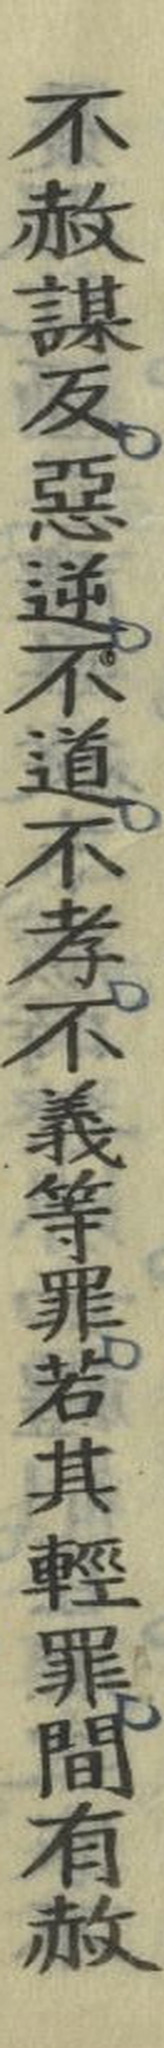不赦謀反。惡逆。不道。不孝。不義等罪。若其輕罪。間有赦
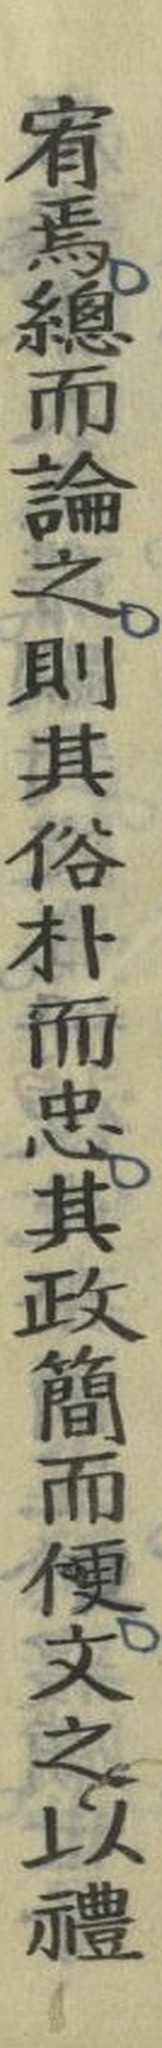宥焉。總而論之。則其俗朴而忠。其政簡而便。文之以禮
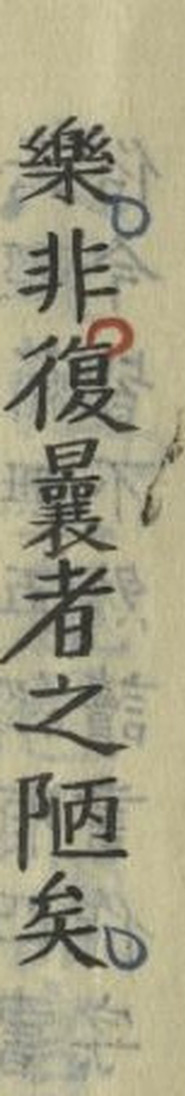樂。非復曩者之陋矣。
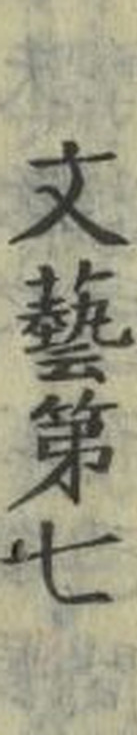文藝第七
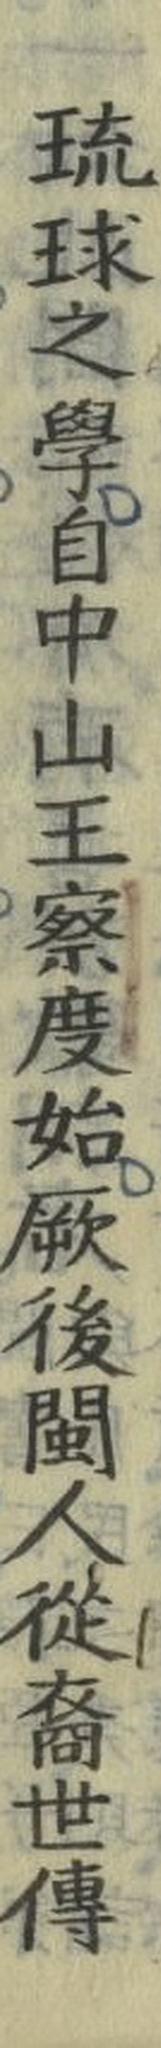琉球之學。自中山王察度始。厥後閩人從裔世傳
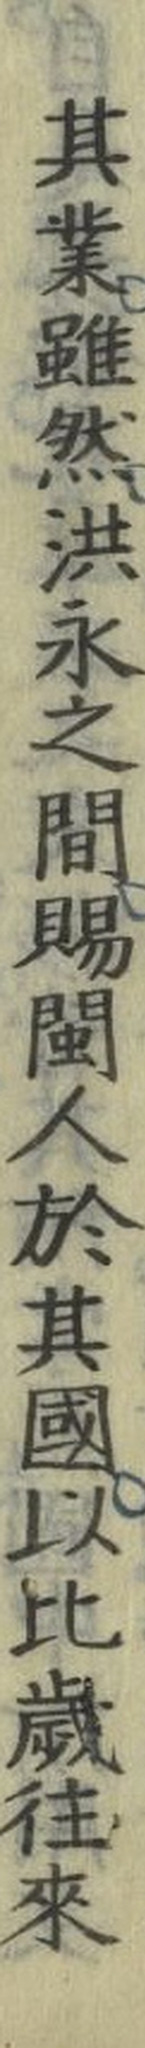其業。雖然。洪永之間。賜閩人於其國。以比歲往來
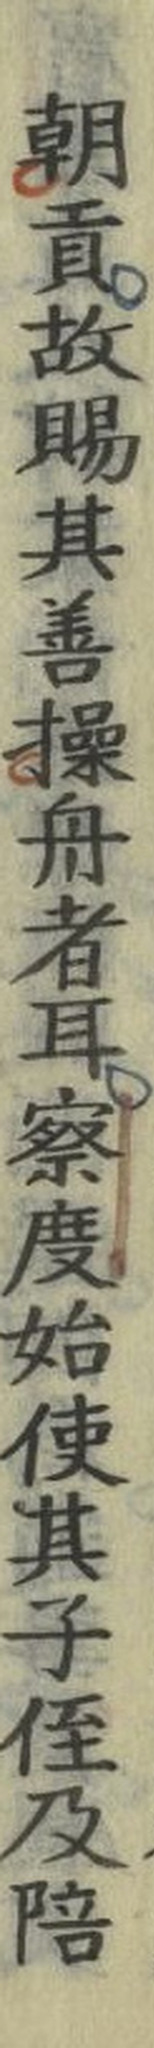朝貢。故賜其善操舟者耳。察度始使其子侄及陪
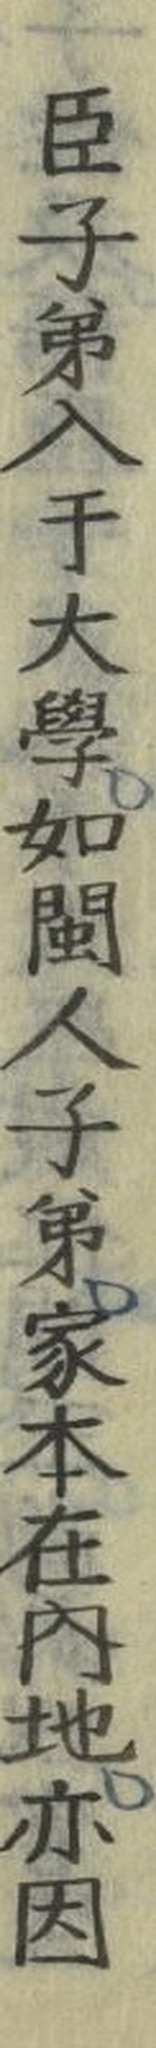臣子弟入于大學。如閩人子弟。家本在内地。亦因
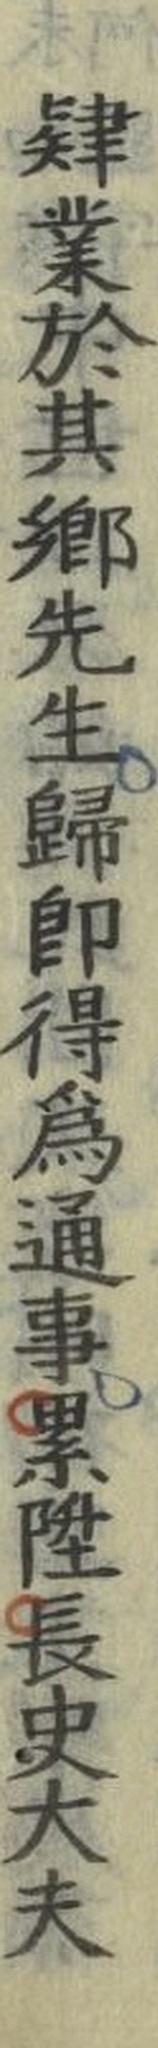肄業於其鄕先生。歸卽得爲通事。累陞長史大夫
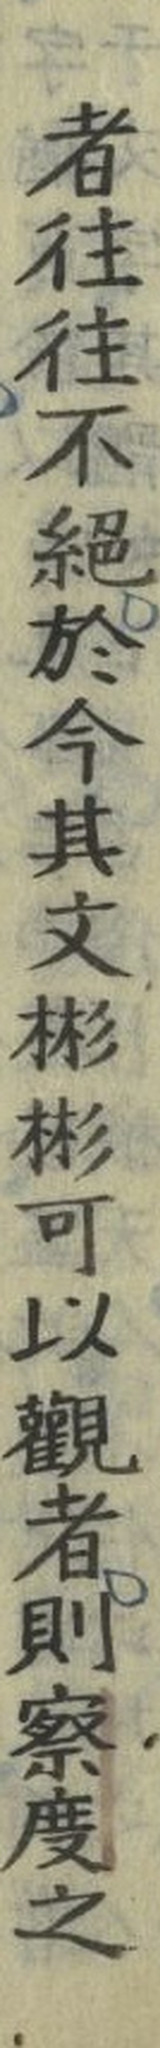者往往不絕。於今其文彬彬可以觀者。則察度之
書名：南島志
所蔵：University of the Ryukyus Library
